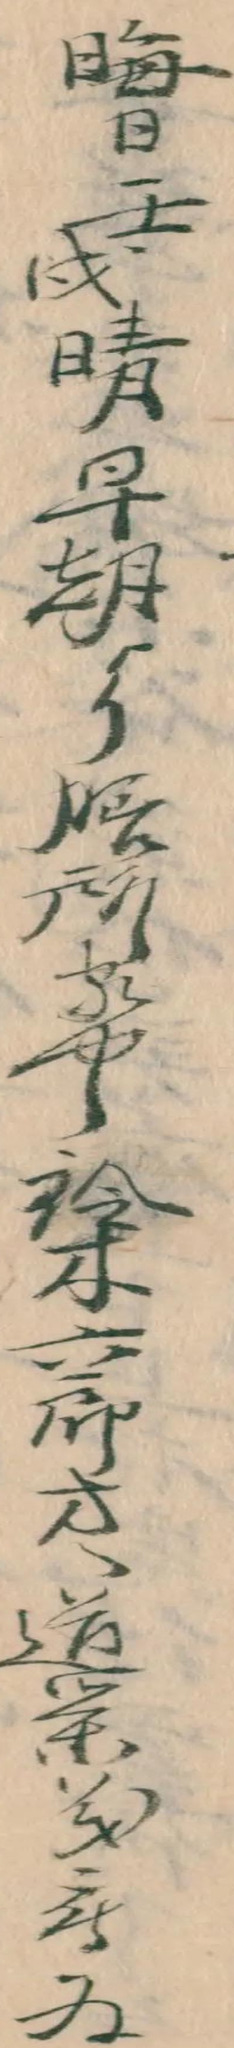晦日壬戌晴早朝より膳所家中鈴木六郎方へ道栄義ニ付為
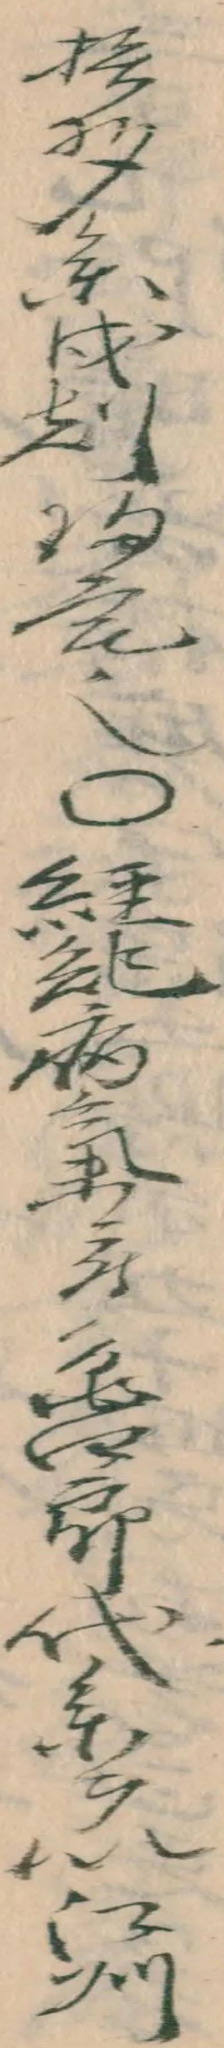挨拶参戌刻帰宅也○経紀病氣ニ付亀四郎代参ヲ以江州
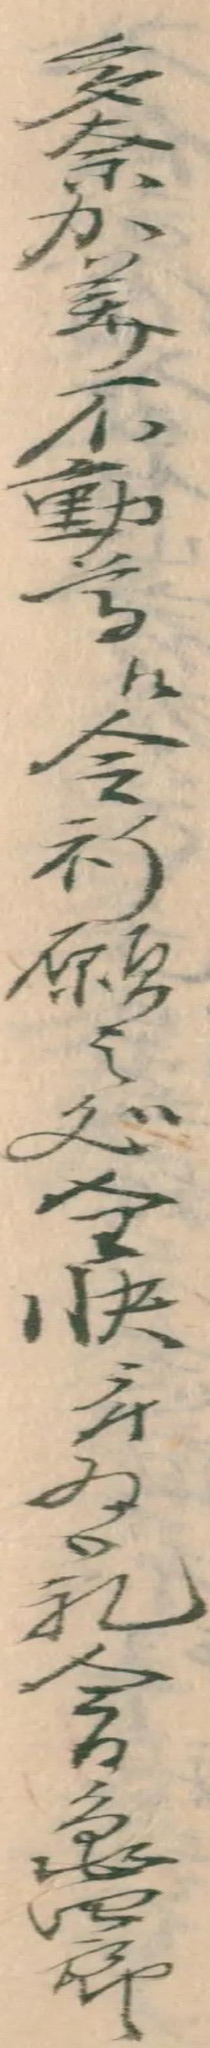多奈加美不動尊え令祈願之処全快ニ付為御礼今日亀四郎
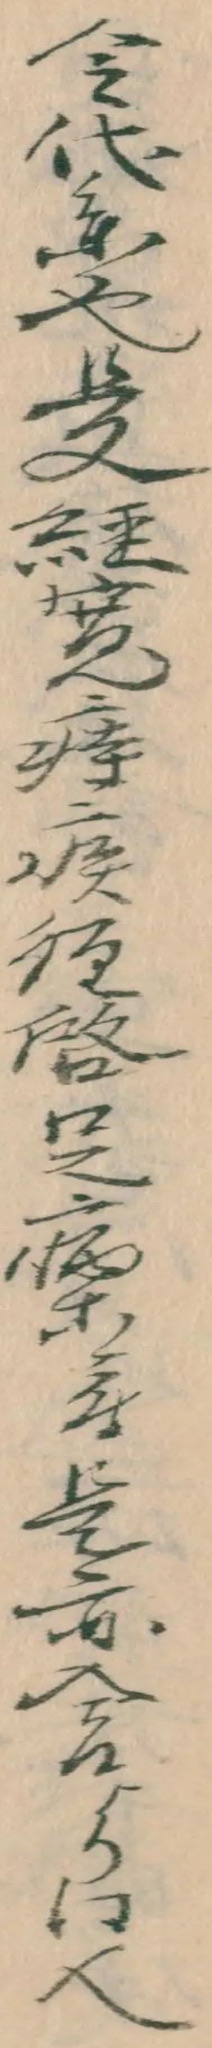令代参也且又経寛痔疾経啓足病等ニ付是亦今日より同人
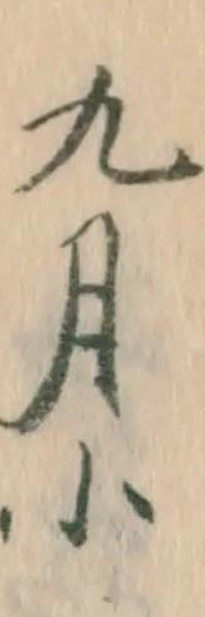九月小
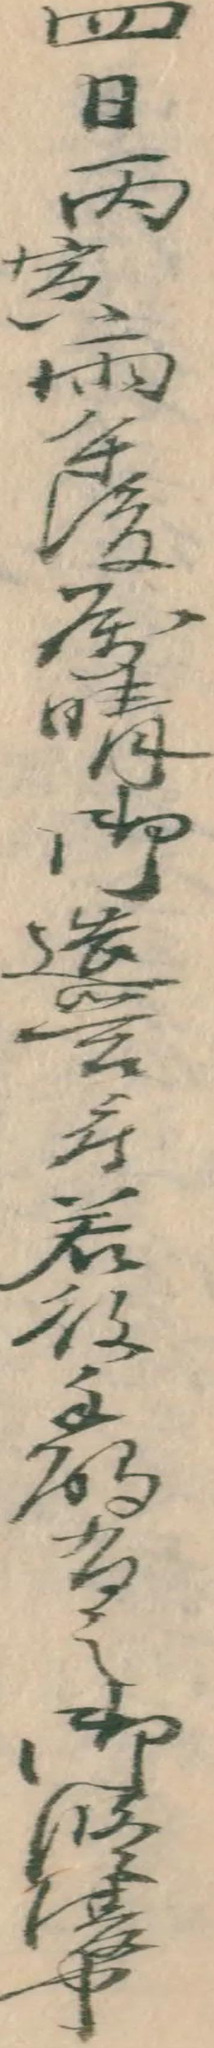四日丙寅雨午後属晴御造営ニ付若役手觸有之御修復中
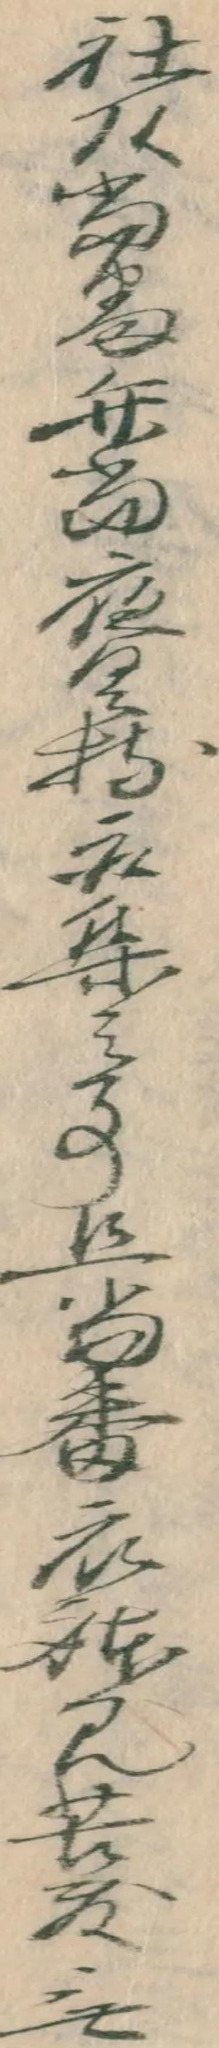社頭當番弁当夜具持取集之事且當番衣躰見苦敷無
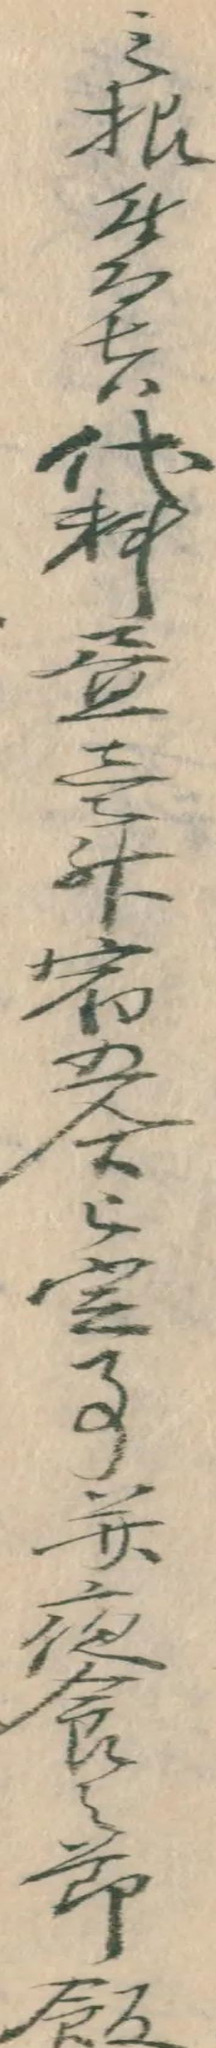之様付而は代料昼壱升宿五合被定事并夜食之節飯
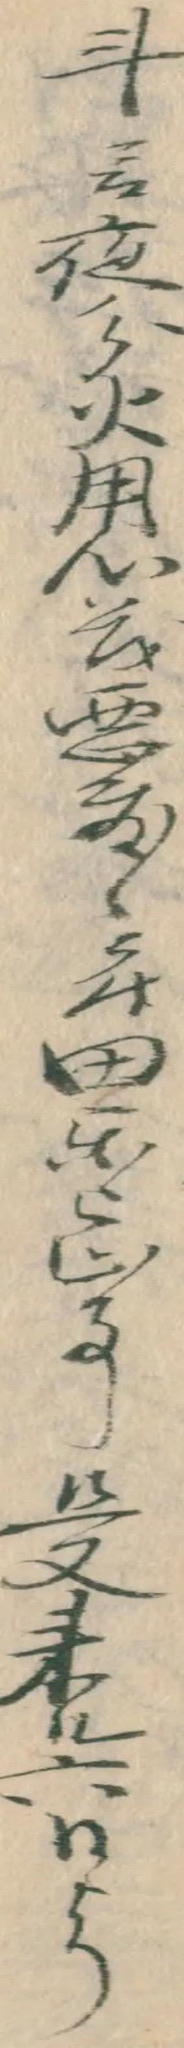斗ニ而夜分火用心も悪敷候ニ付田楽被止事且又来ル六日より
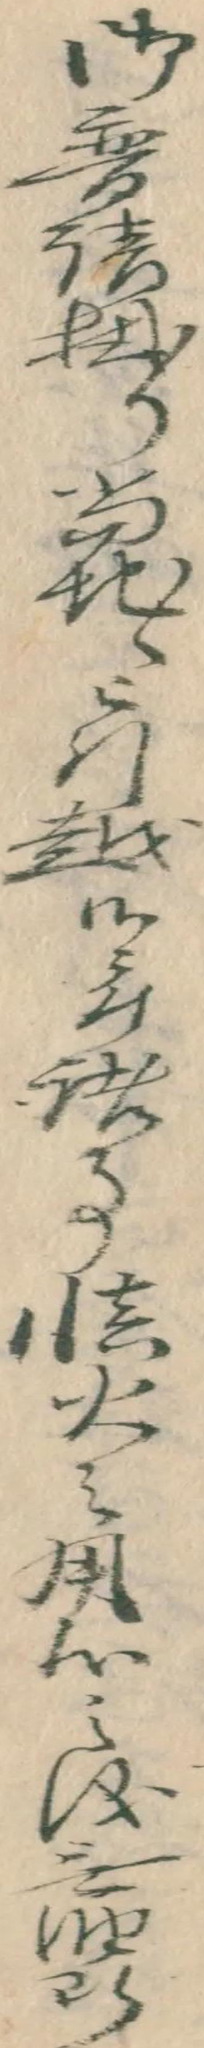御普請掛り當地へ被引越候ニ付諸事慎火之用心之儀無油断
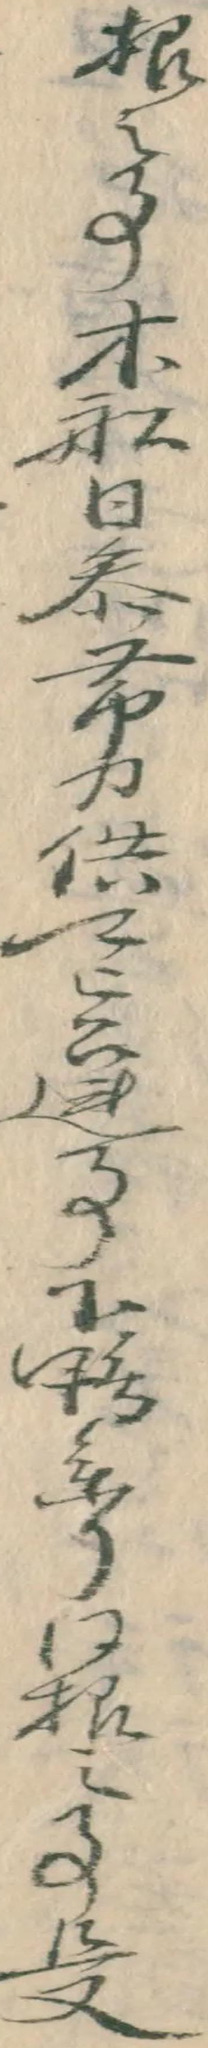様之事木舩日参帯刀供可被召連事下鴨参り同様之事是又
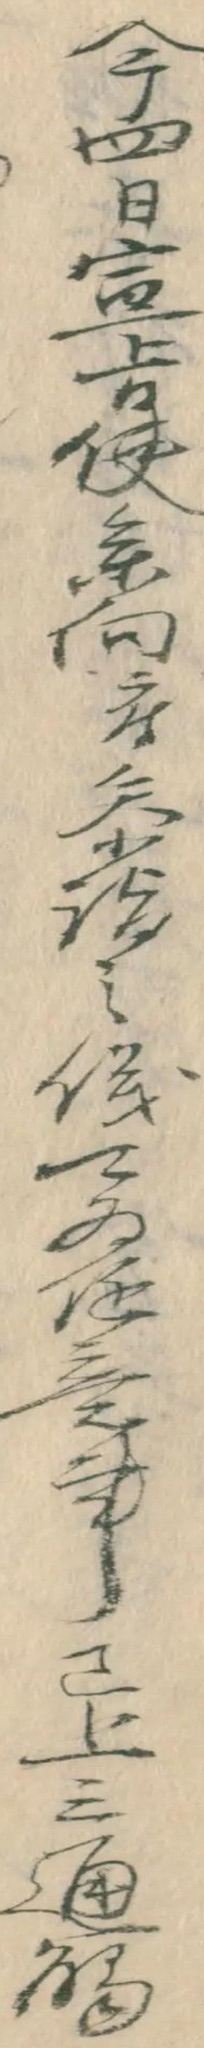今四日宣旨使参向に付参詣之儀可為意事已上三通觸
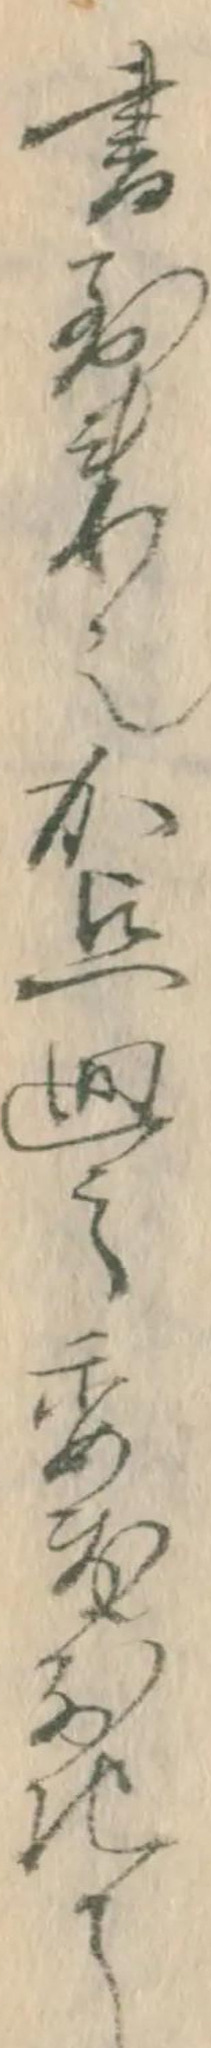書到来之加点廻之委敷別記了

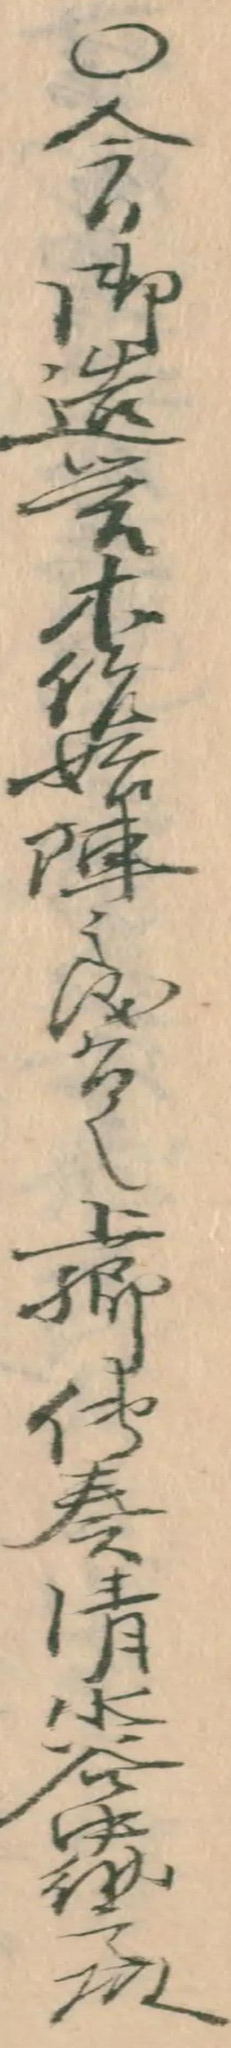○今日御造営木作始陣之儀有之上卿傳奏清水谷中納言殿
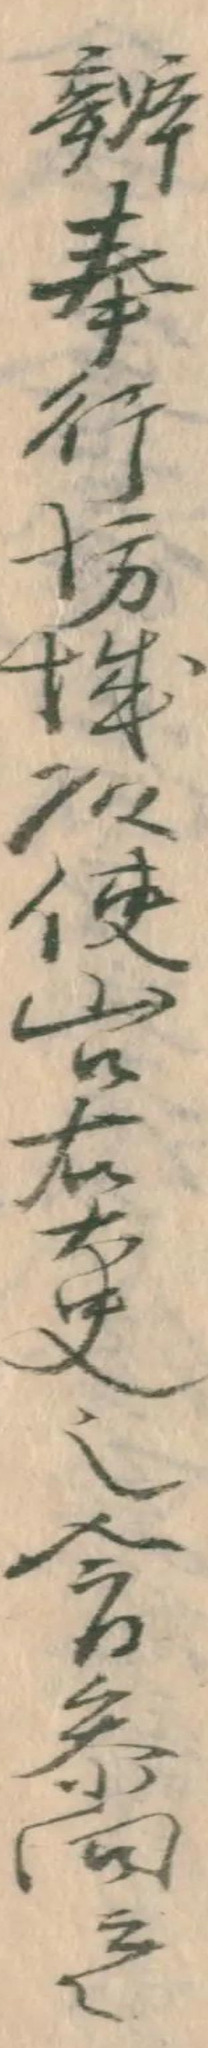辨奉行坊城殿使山口右大史也今日参向云々
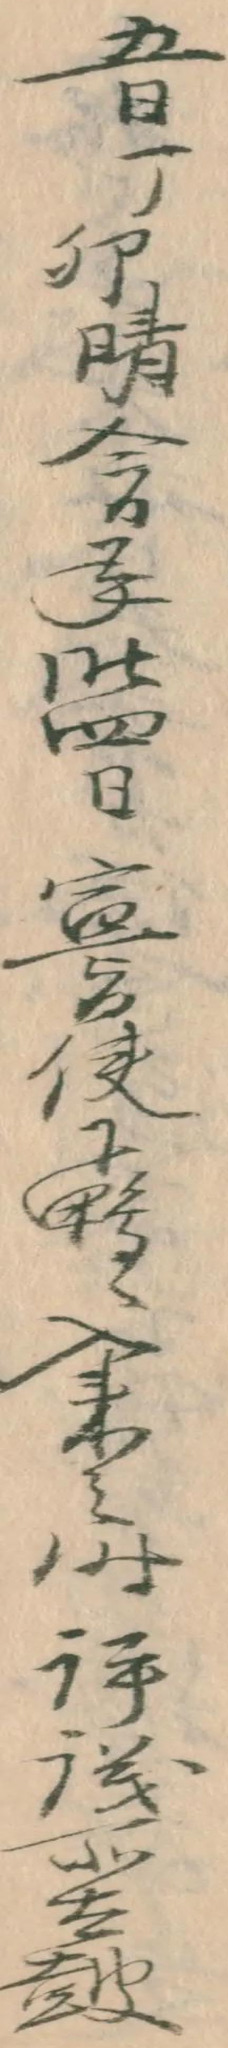五日丁卯晴今日承昨四日宣使使下鴨へ入来之時評議所太皷
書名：賀茂社記録. 第66冊
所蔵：国立国会図書館 National Diet Library, JAPAN
